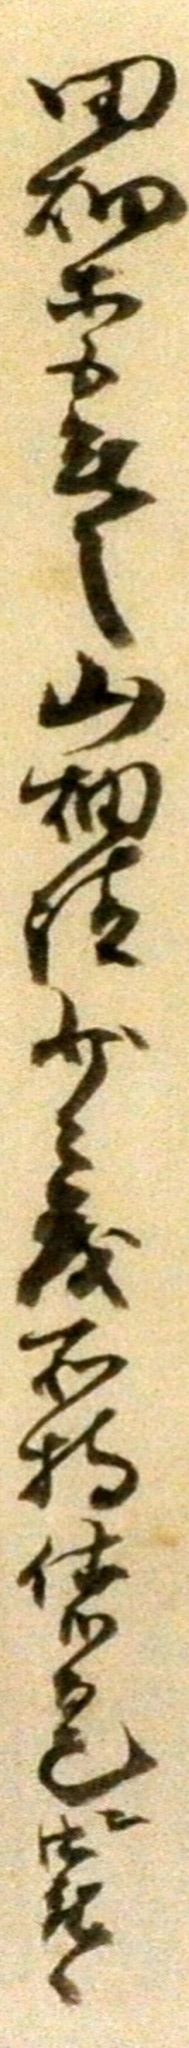田畑等無之山畑僅少ニ茂所持仕候而巳二御座候
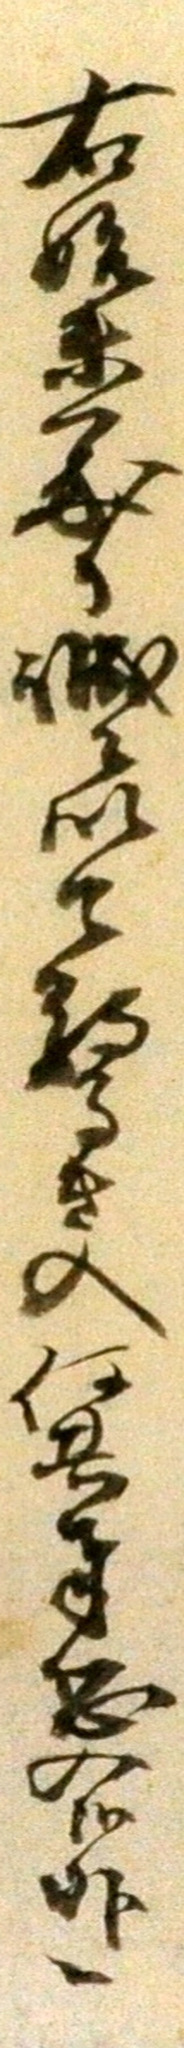右始末承り誠二以て驚き入何共奉恐入候外二
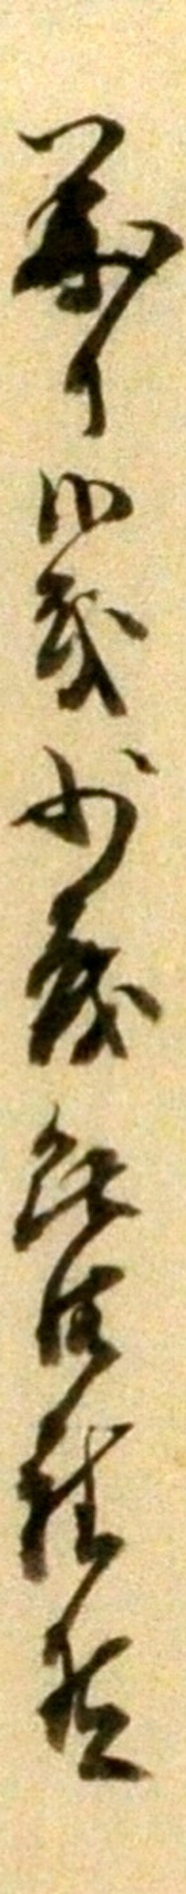承り候義少茂無御座候
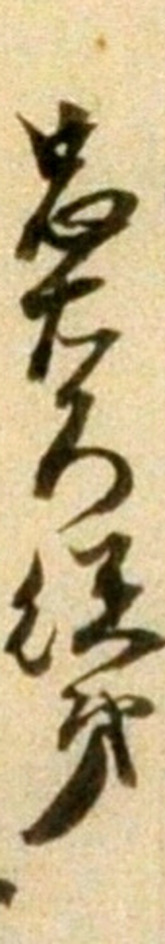忠右衛門兄
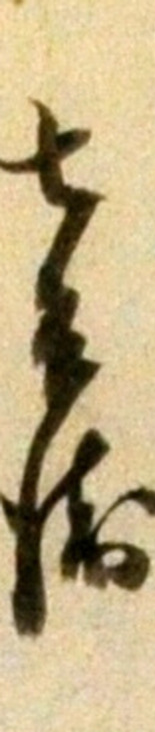七兵衛
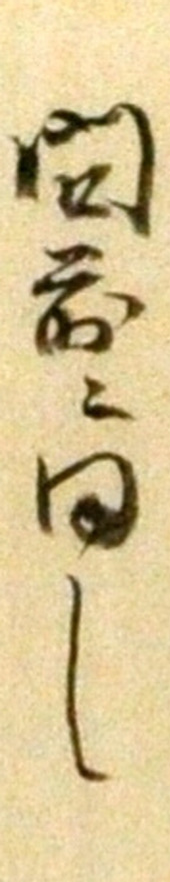問前ニ同じ
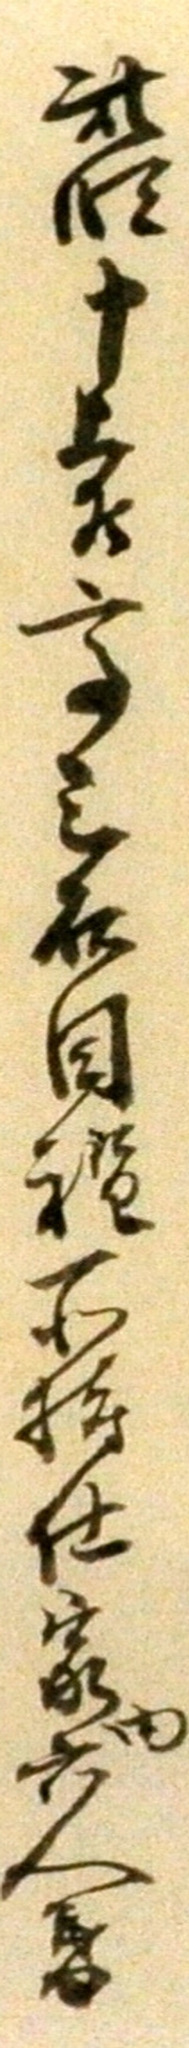此段申上候高三石目禮所持仕家内六人暮
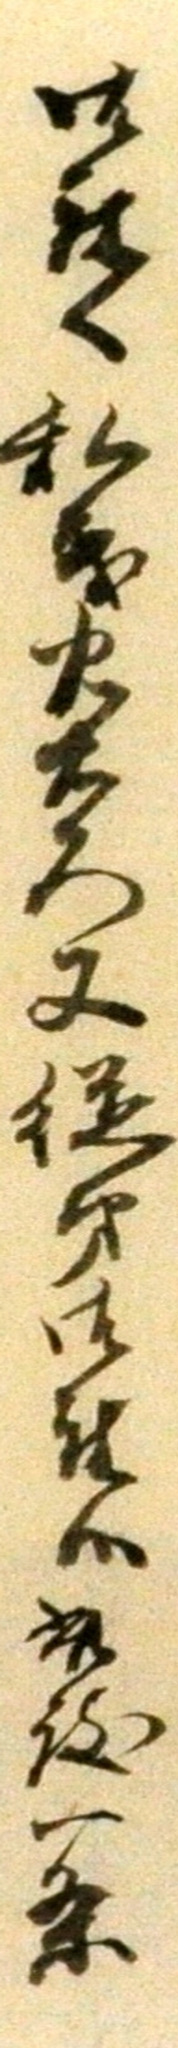御座候私義忠右衛門又従弟御座候此一条
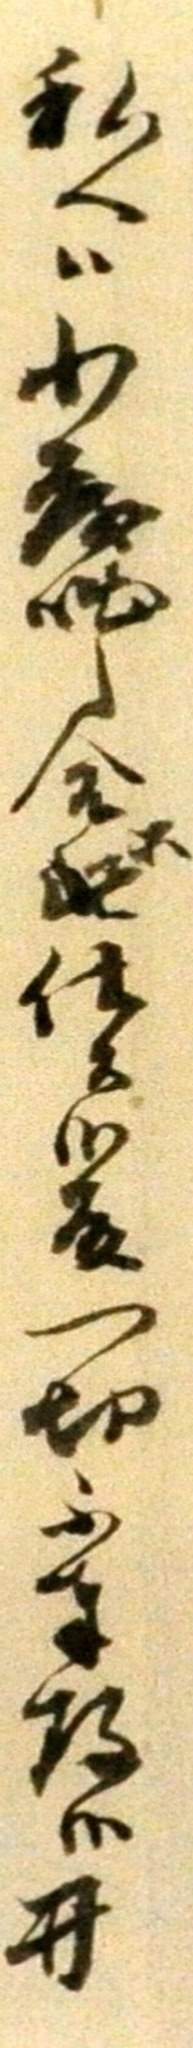私へㇵ少茂咄し合無仕方候故一切不奉存候井
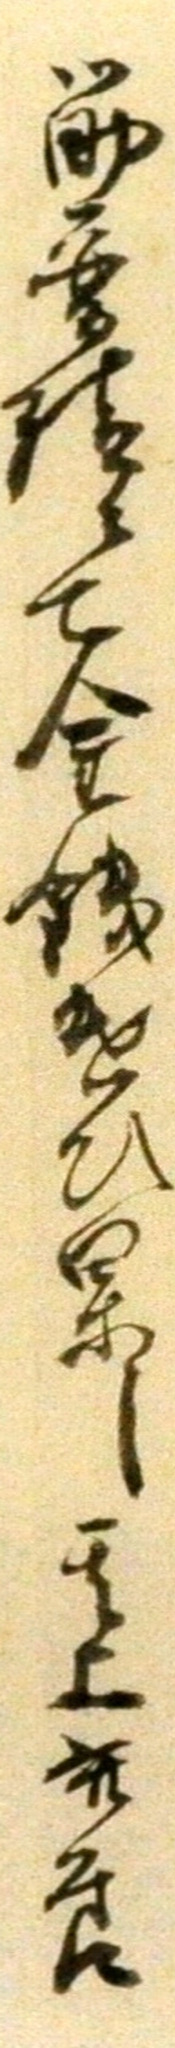筋普請二て金銭遣ひ果し其上幷節
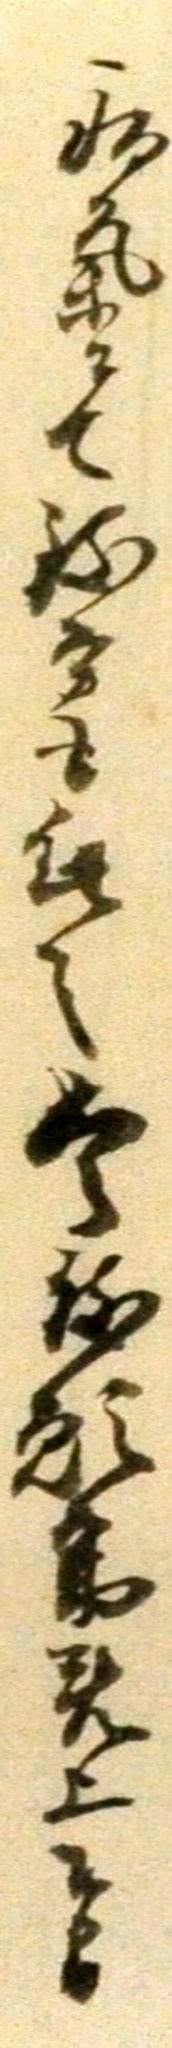病気二て致方も無之今致願書差上之旨
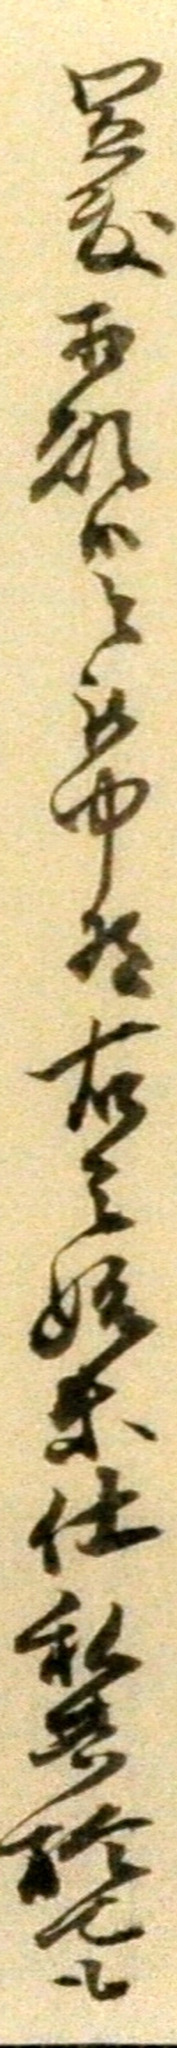宜敷相願候と被申候右之始末仕私共於ても
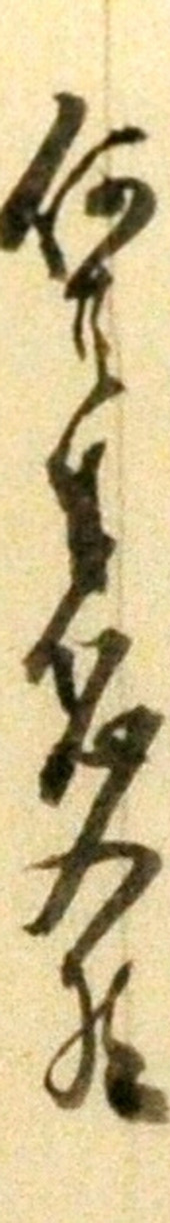何共奉恐入候
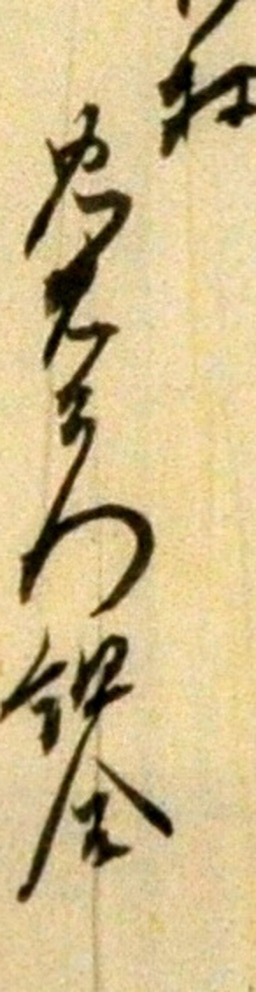忠右衛門組合
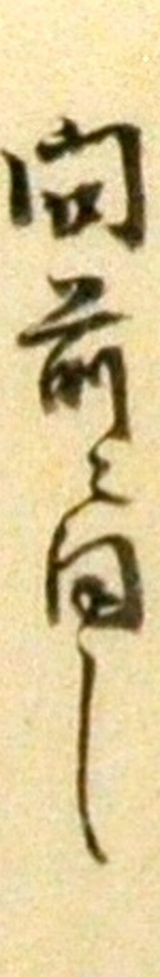問前ニ同じ
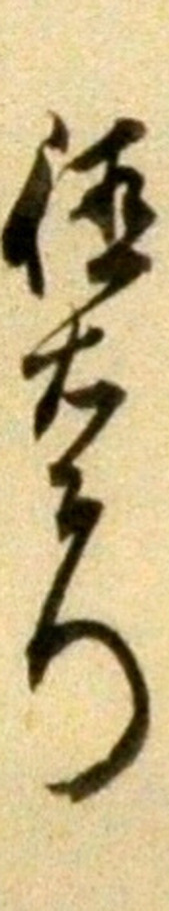徳右エ門
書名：中沢村駕籠訴事件書類写
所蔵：伊那市立高遠町図書館・合同会社AMANE
